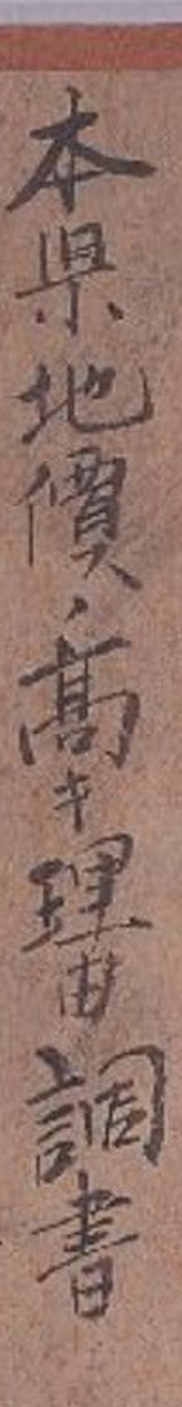本県地價ノ髙キ理由調書

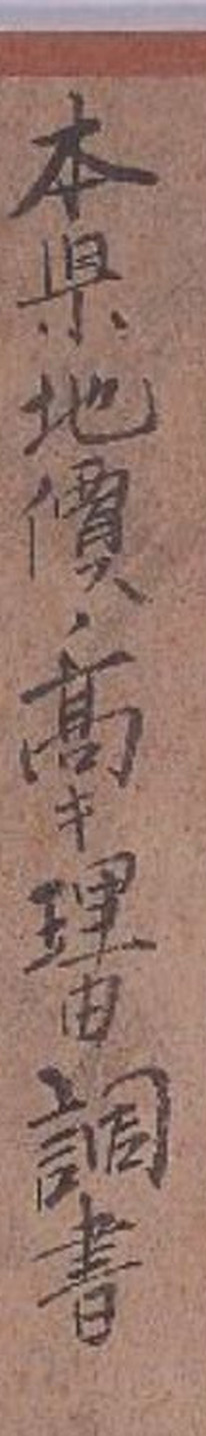本県地價ノ髙キ理由調書

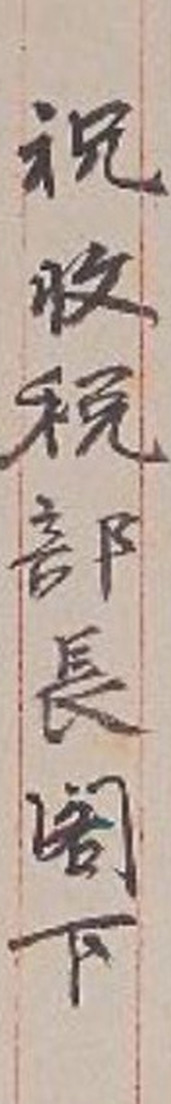祝収税部長閣下

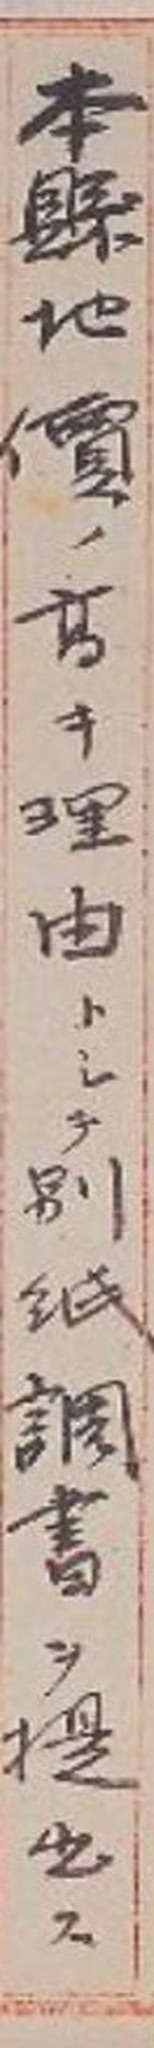本縣地價ノ髙キ理由トシテ別紙調書ヲ提出ス
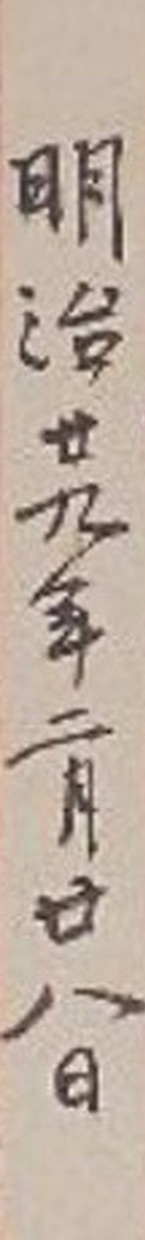明治廿九年二月廿八日
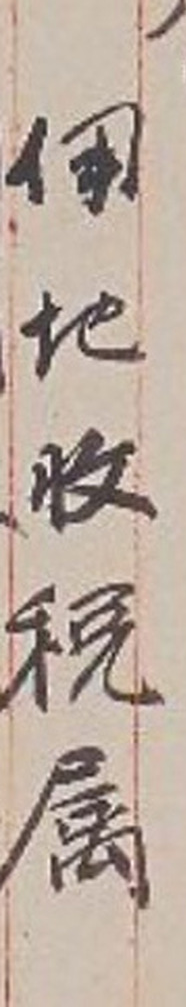伊地收税属
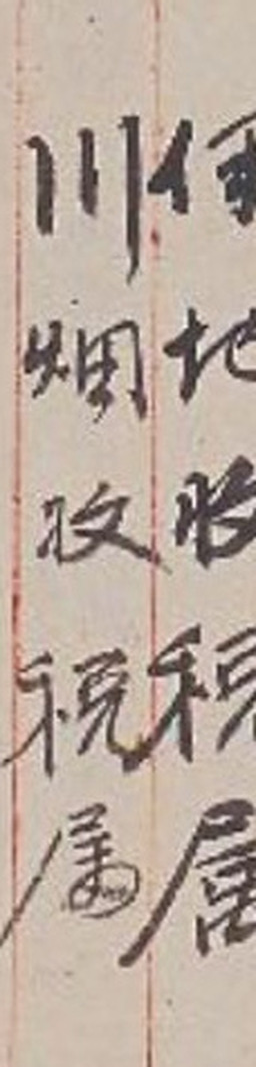川畑收税属
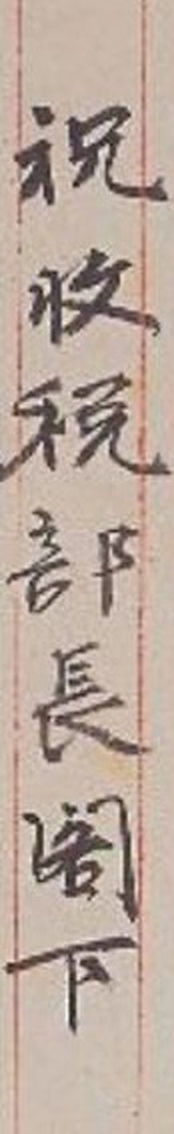祝收税部長閣下

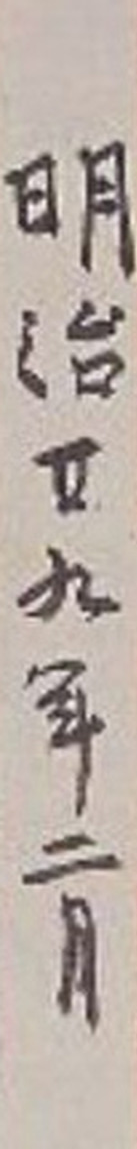明治廿九年二月
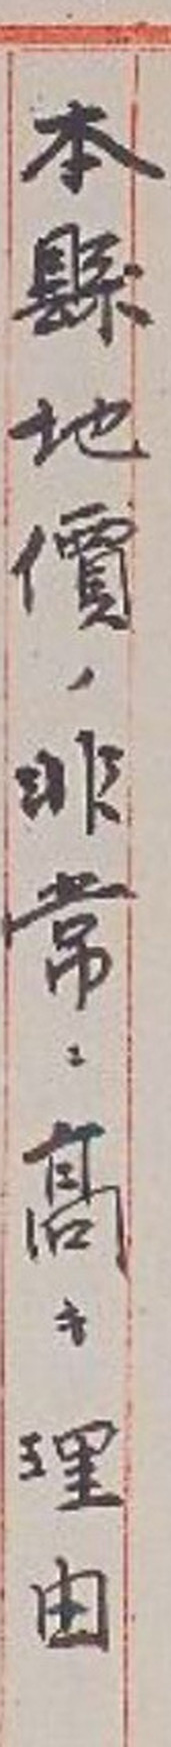本縣地價ノ非常ニ髙キ理由

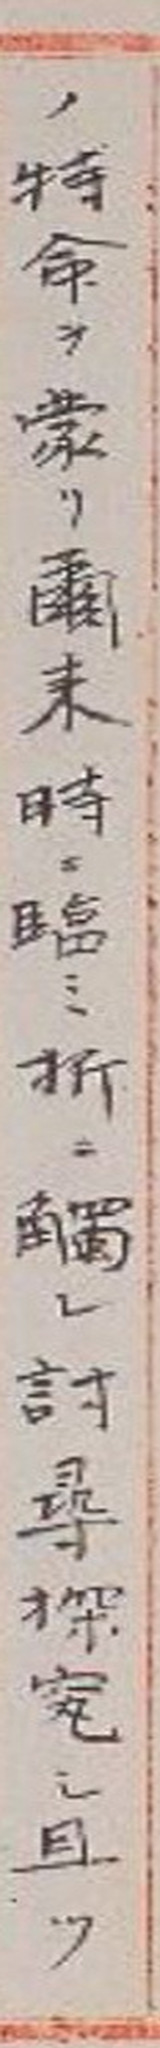ノ特命ヲ蒙リ爾来時ニ臨ミ折ニ觸レ討尋探究シ且ツ
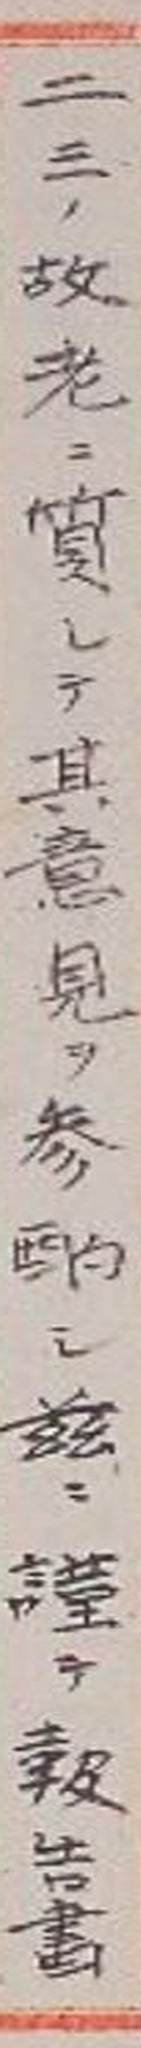二三ノ故老ニ質シテ其意見ヲ参酌シ茲ニ謹テ報告書
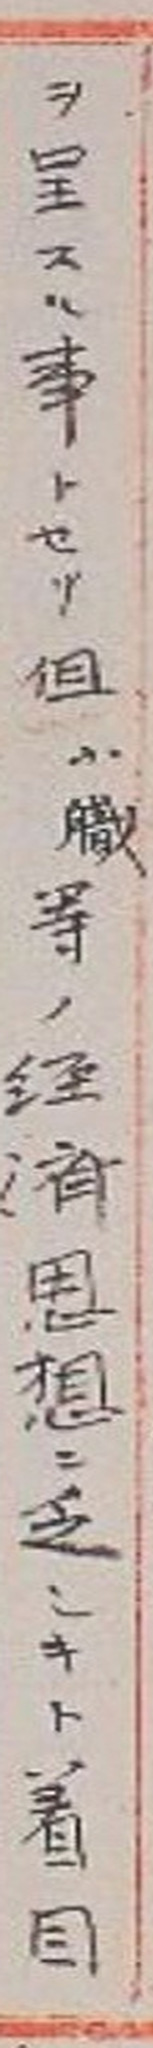ヲ呈スル事トセリ但小職等ノ経済思想ニ乏シキト着目
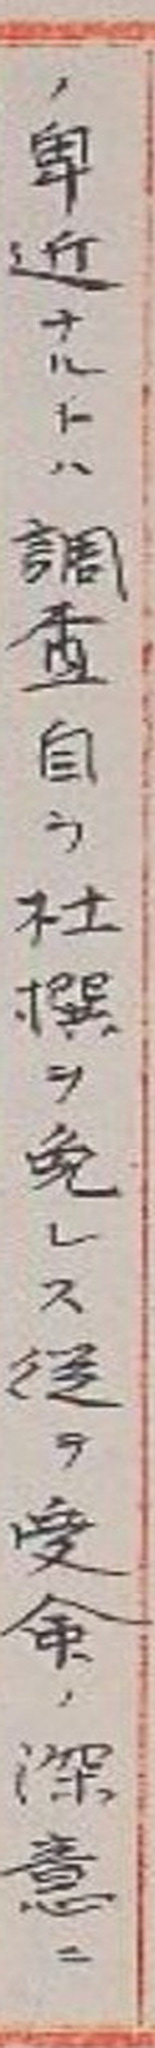ノ卑近ナルトハ調査自ラ杜撰ヲ免レス従テ受命ノ深意ニ
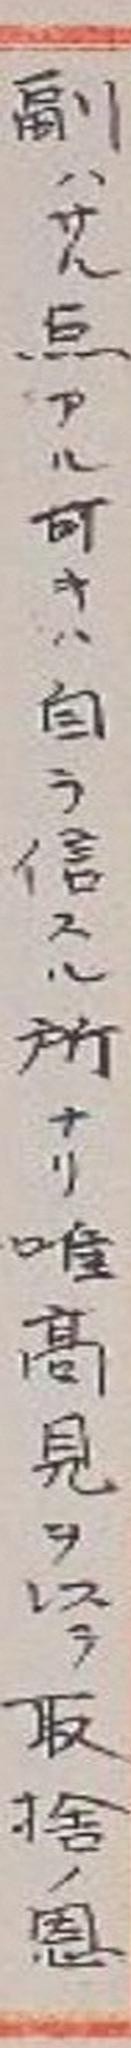副ハサル点アル可キハ自ラ信スル所ナリ唯髙見ヲ以テ取捨ノ恩
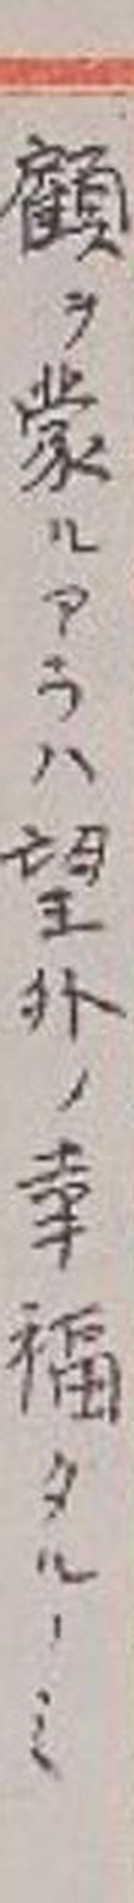顧ヲ蒙ルアラハ望外ノ幸福タルノミ
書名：本県地価ノ高キ理由調書
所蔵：University of the Ryukyus Library
